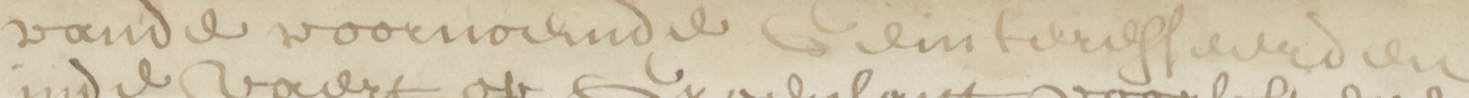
vande voornoemde Geinteresseerden
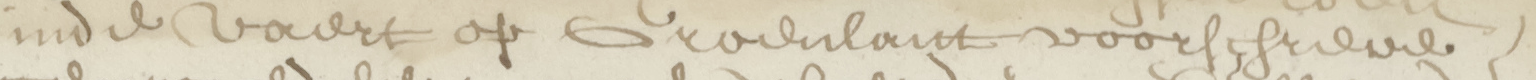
inde vaert op Groenlant voorschreve
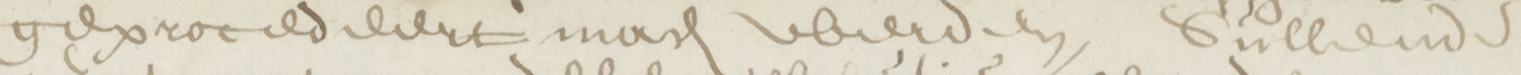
geprocedeert mach werden. Sullende
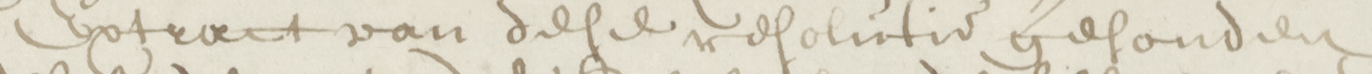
Extract van dese resolutie gesonden
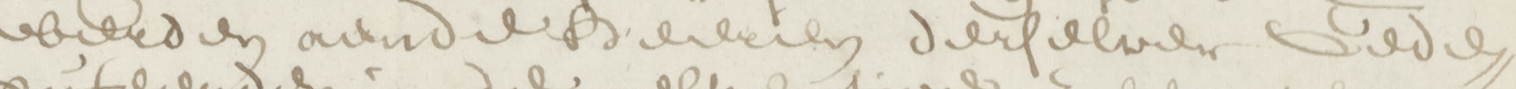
werden aende Heeren derselver Gede,,
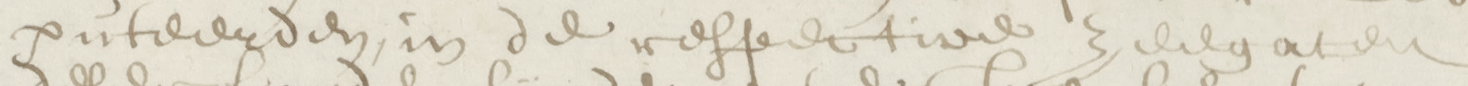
puteerden, in de respective zeegaten
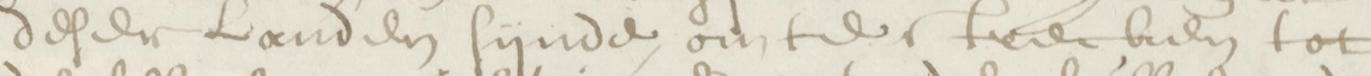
deser Landen sijnde, om te strecken tot
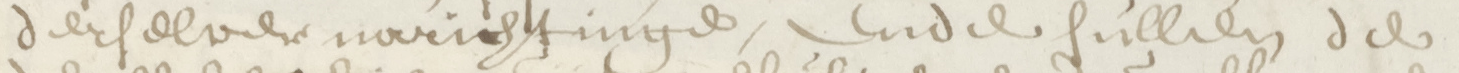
derselver narichtinge. Ende sullen de
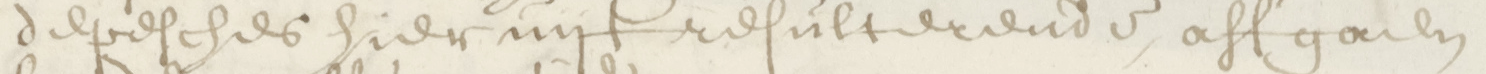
depesches hier uijt resulterende, affgaen
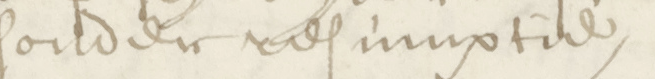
sonder resumptie.
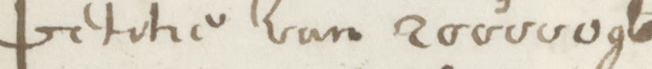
Petitie van 200000 gls
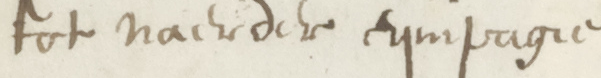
tot naerder equipagie
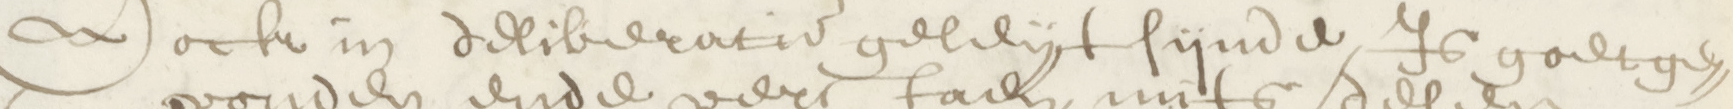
Oock in deliberatie geleijt sijnde, Is goetge,,
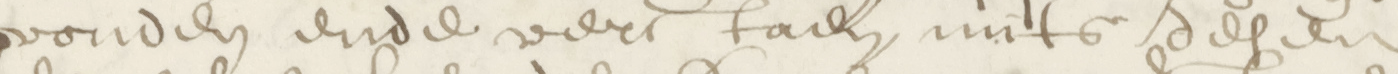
vonden ende verstaen, mits desen
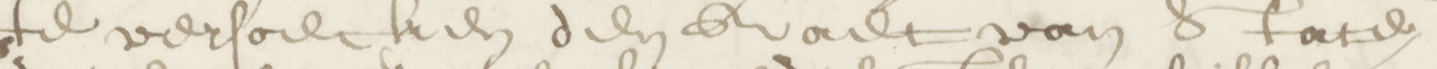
te versoecken den Raet van State
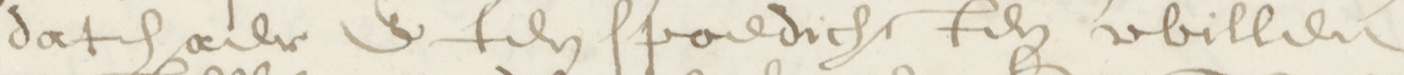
dat haer E. ten spoedichsten willen
